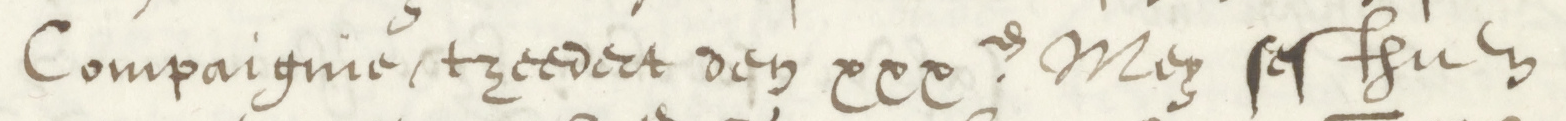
Compaignie, tzeedert den xxxe. Mey sesthien
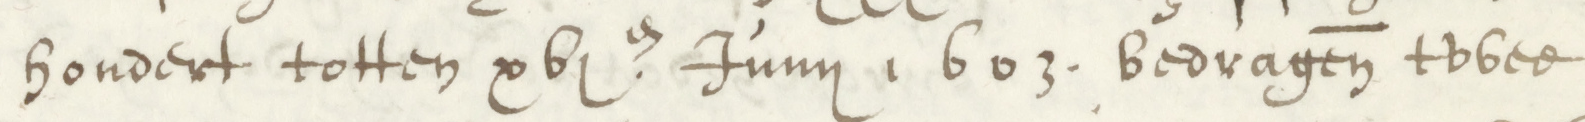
hondert totten xvje. Juny 1603. bedragen twee
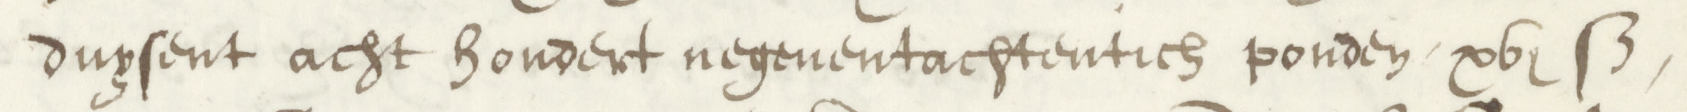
duysent acht hondert negenentachtentich ponden xvj sc,
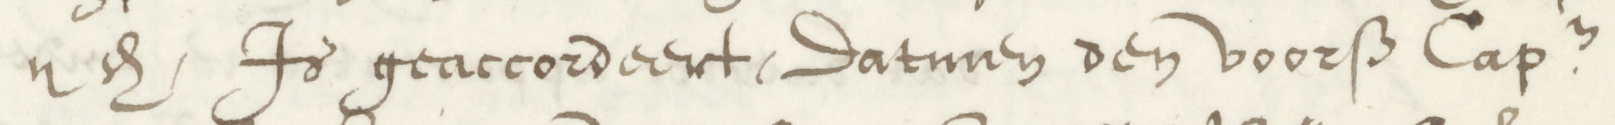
ii d. Is geaccordeert datmen den voors Capn
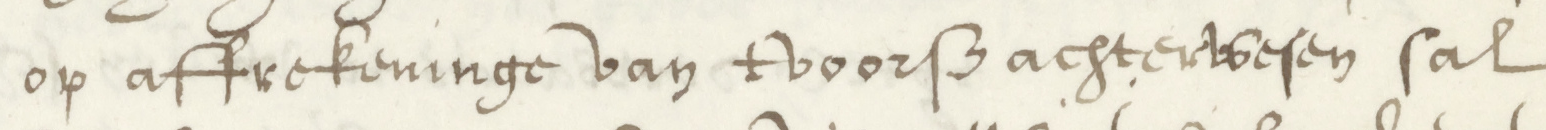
op affrekeninge van tvoors achterwesen sal
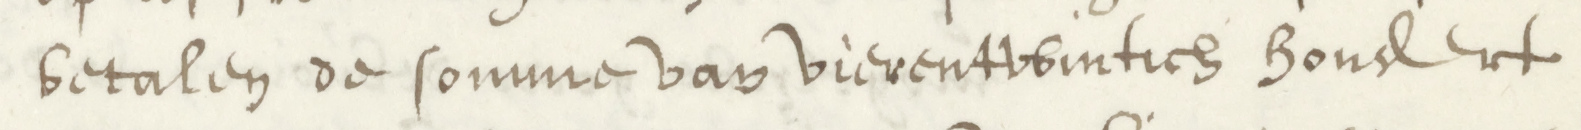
betalen de somme van vierentwintich hondert
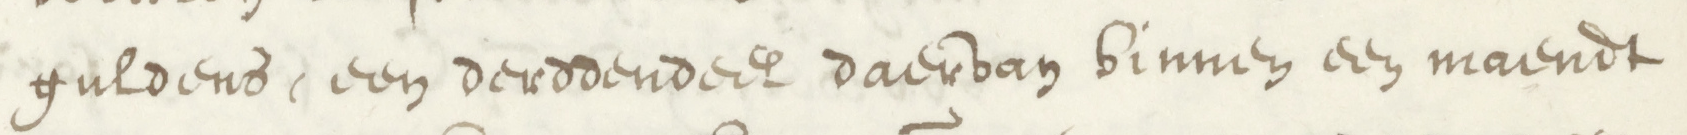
guldens, een derddendeel daervan binnen een maendt
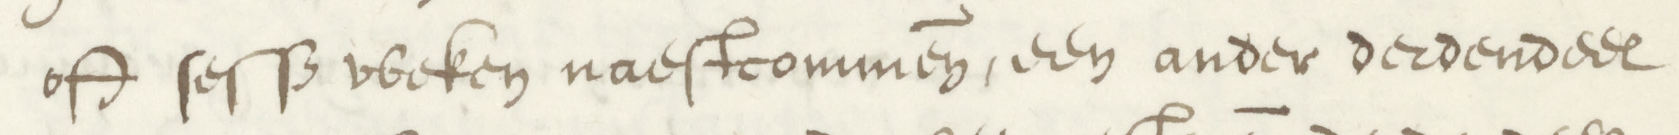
off sess weken naestcomen, een ander derdendeel
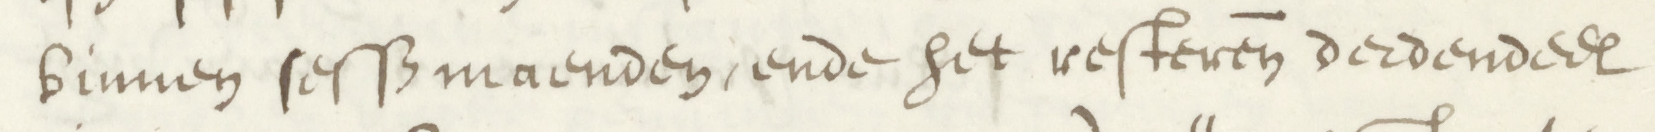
binnen sess maenden, ende het resteren derdendeel
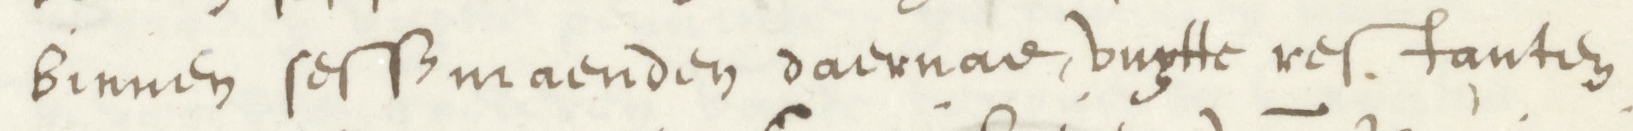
binnen sess maenden daernae, vuytte restanten
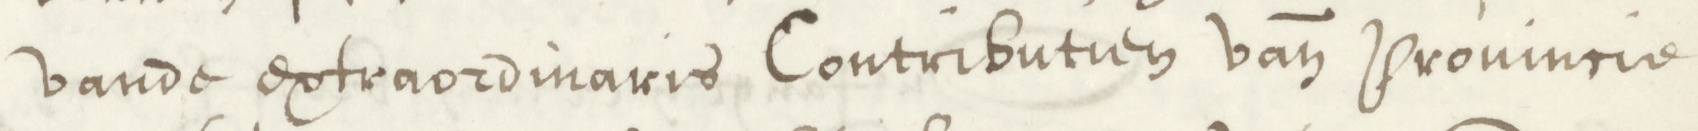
vande extraordinaris Contributien van provincie
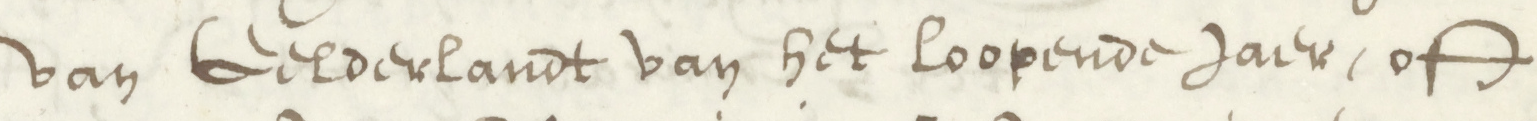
van Gelderlandt van het loopende jaer, off
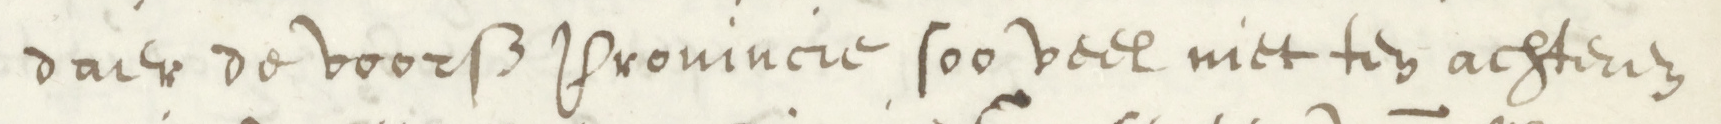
daer de voors provincie soo veel niet ten achteren
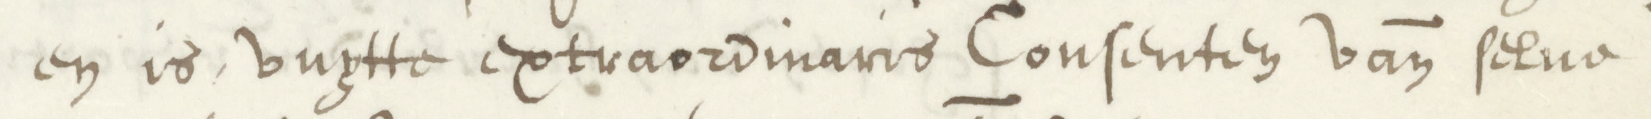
en is, vuytte extraordinaris consenten van selue
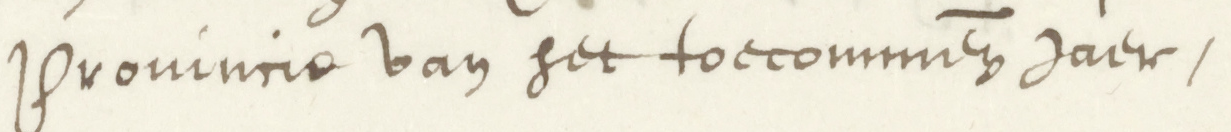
provincie het toecommen jaer.
